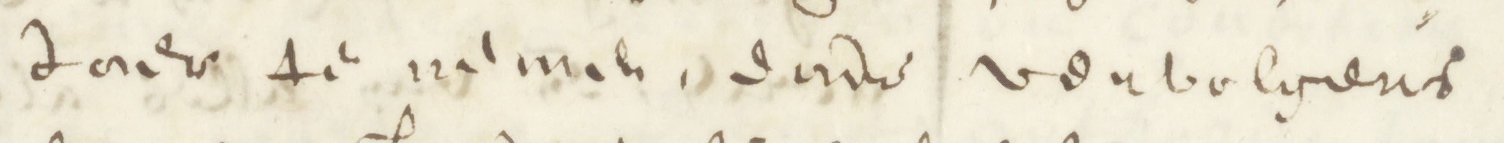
daer te nemen, ende vervolgens
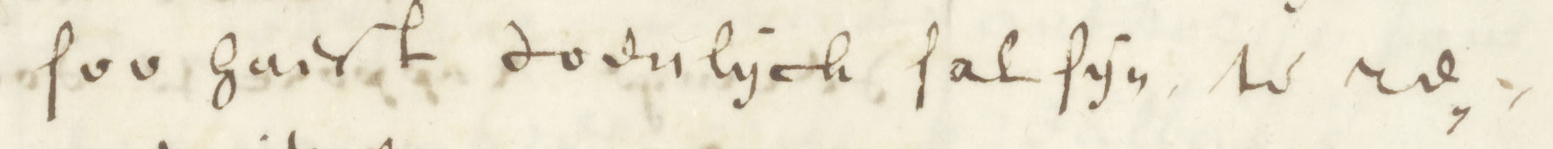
soo haest doenlijck sal sijn te re„
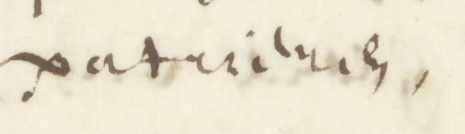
patrieren.
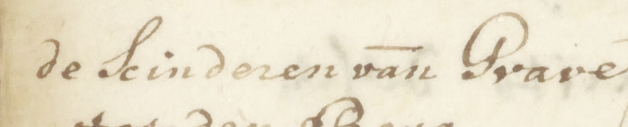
de kinderen van Grave
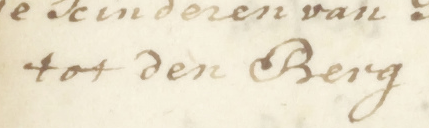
tot den Berg
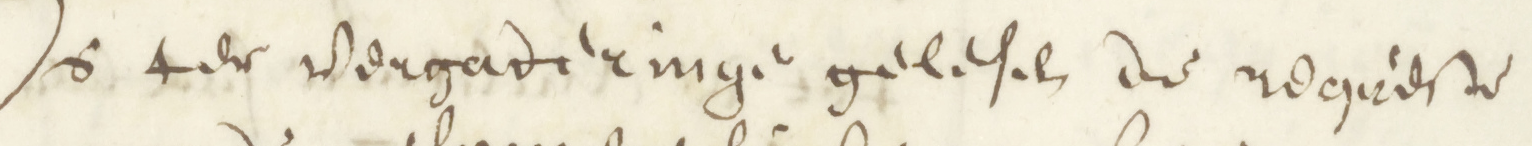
Is ter vergaderinge gelesen de requeste
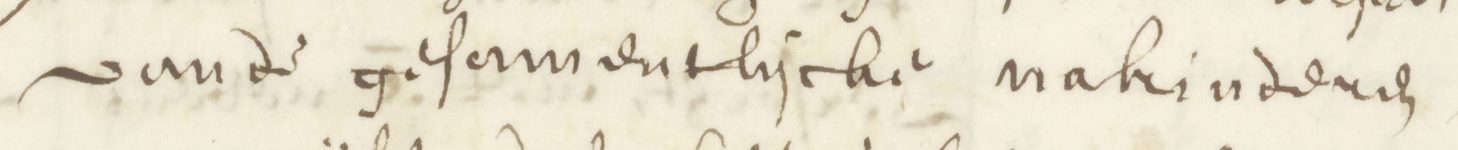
van de gesamentlijcke nakinderen
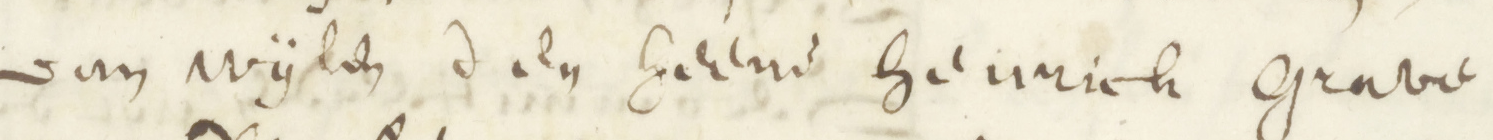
van wijlen den heere henrick Grave
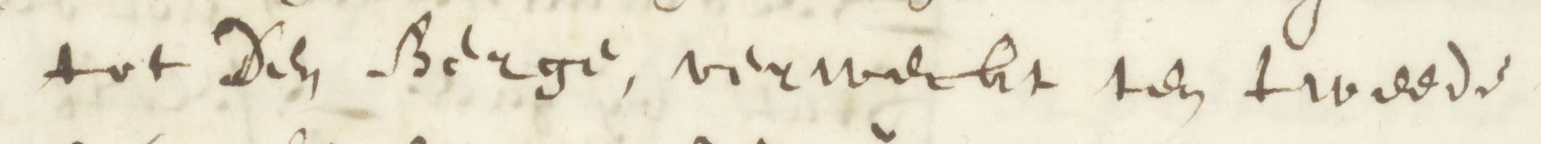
tot den Berge, verweckt ten tweede
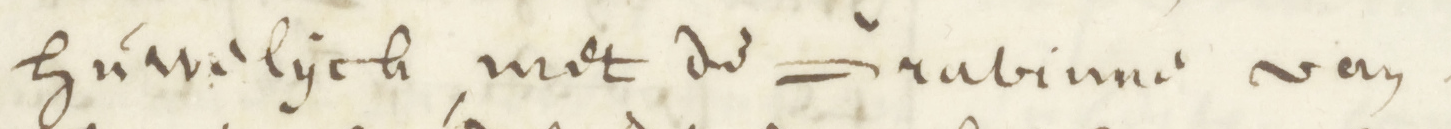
huwelijck met de Gravinne van
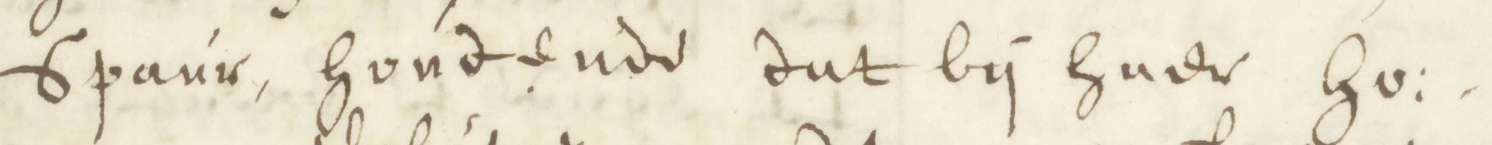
Spaur, houdende dat bij haer Ho:
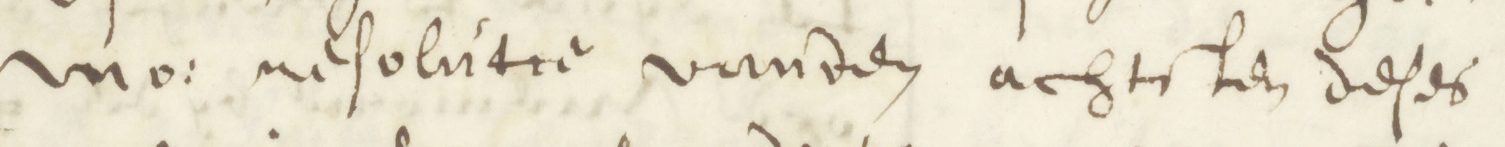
Mo: resolutie vanden achtsten deses
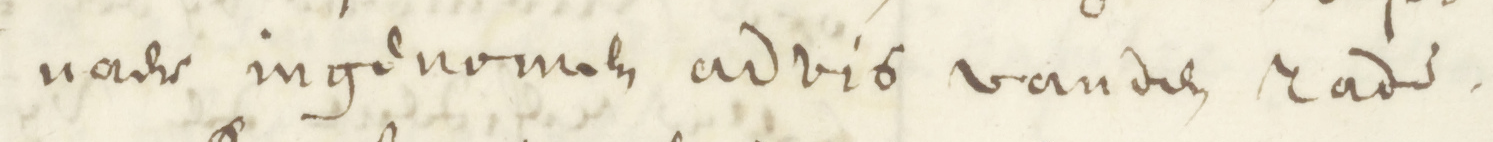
naer ingenomen advis van den rade
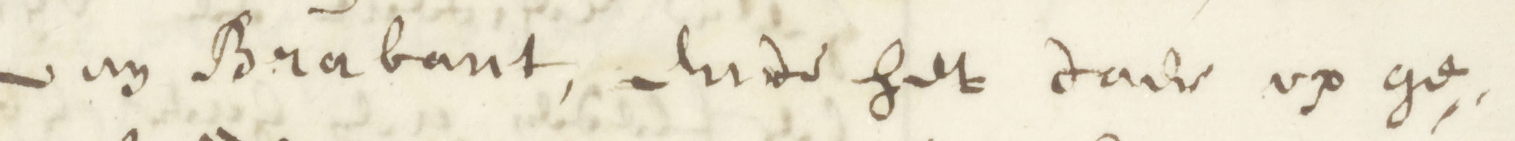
van Brabant, ende het daer op ge„
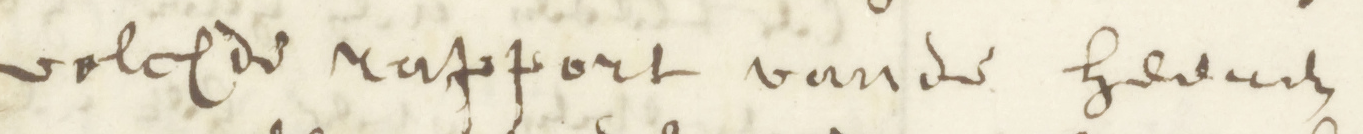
volchde rapport van de heeren
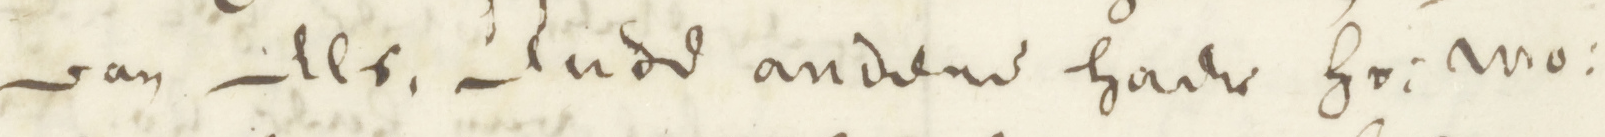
van Els, ende andere haer Ho:Mo:
